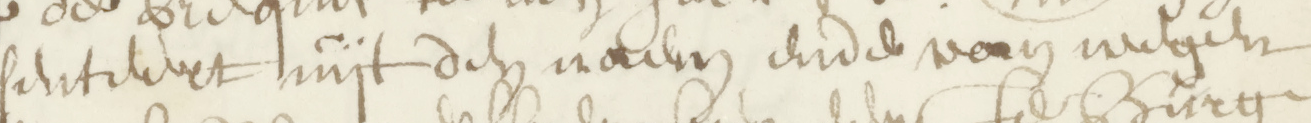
senteert uijt den naem ende van wegen
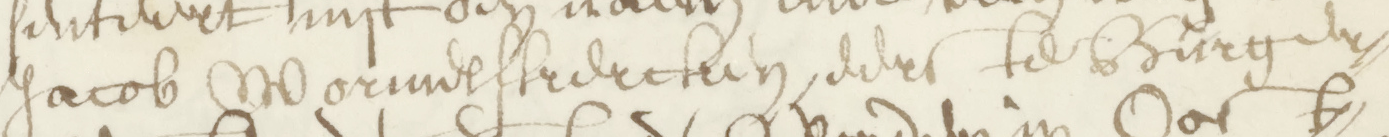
Jacob Wormelskercken, eerste Burger„
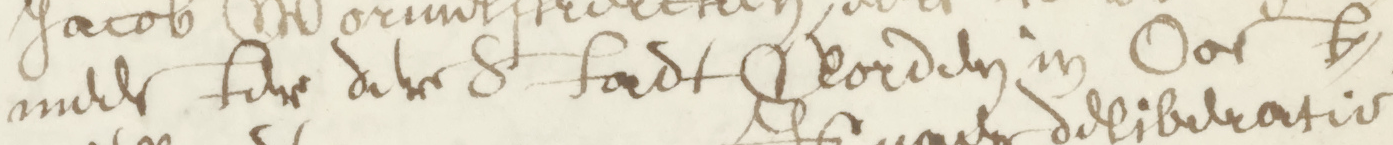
meester der Stadt Norden in Oost„
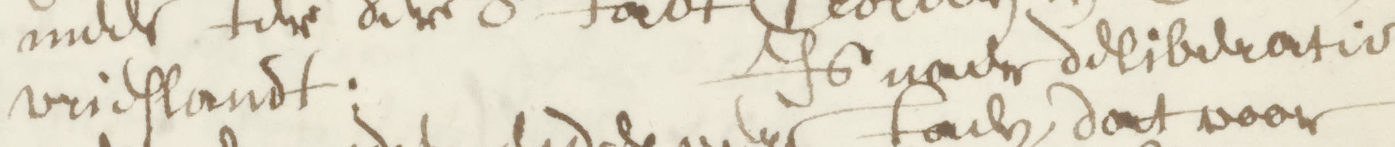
vrieslandt. Is naer deliberatie
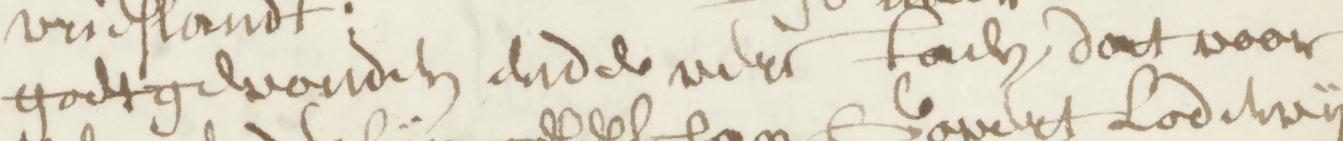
goetgevonden ende verstaen, dat voor
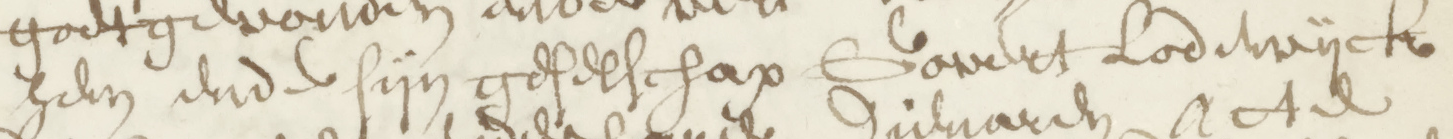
hem ende sijn geselschap Govert Lodewijck
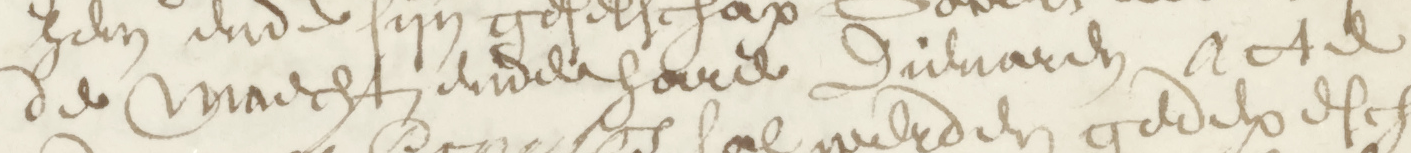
de Maecht, ende hare Dienaren, acte
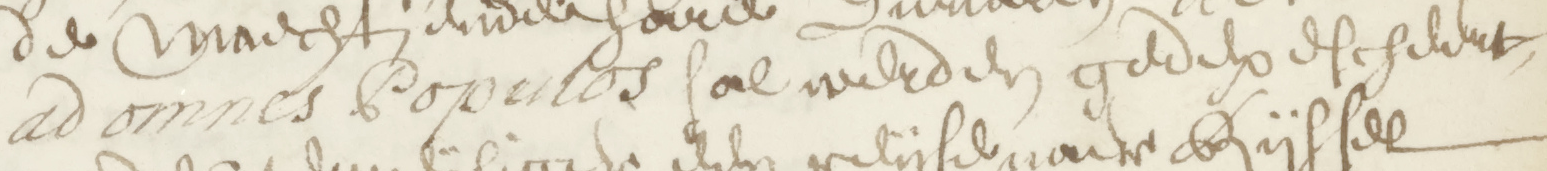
ad omnes Populos sal werden gedepescheert,
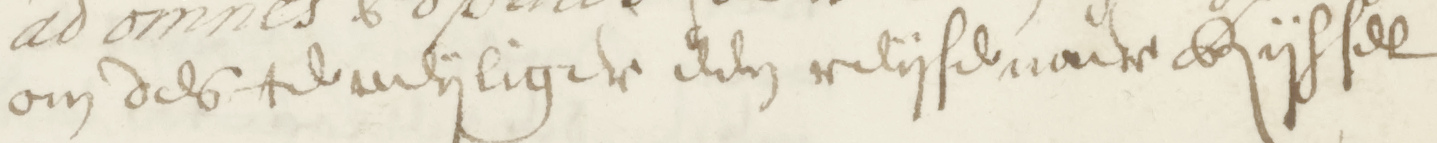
om des te veijliger een reijse naer Rijssel
